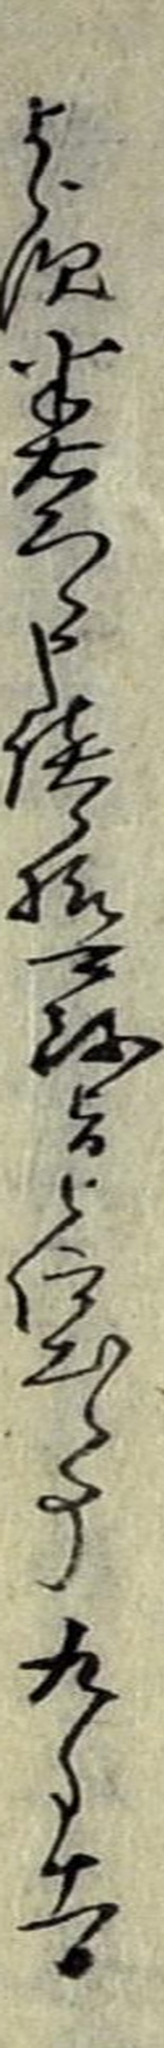よらす半右衛門へ申談候様可致旨被仰出候事九月十一日
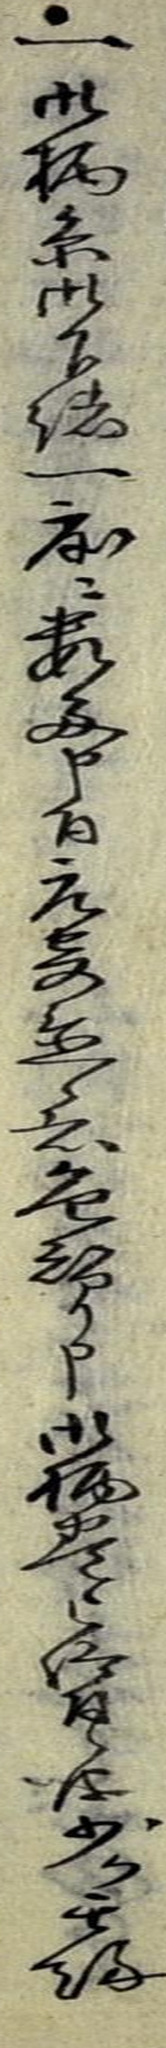一御柄糸御下緒一度ニ数多申付取寄置候者色替り申御柄巻被仰付候儀少ク其余
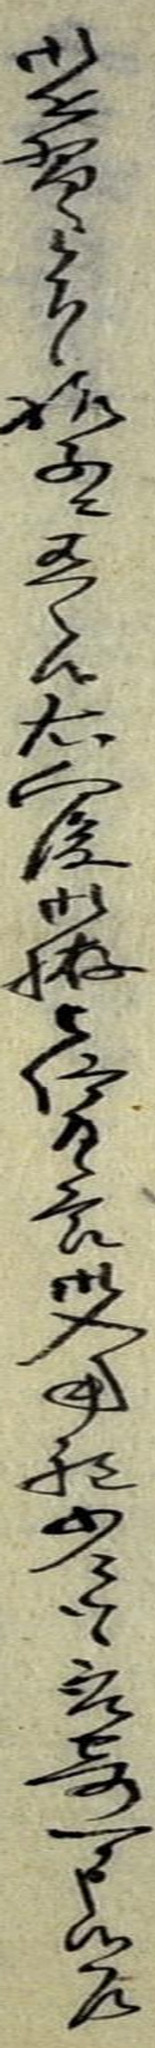御近習へ被下候様子ニ有之候右向後御拵被仰付候節御入用程少々ツヽ取寄可申候乍
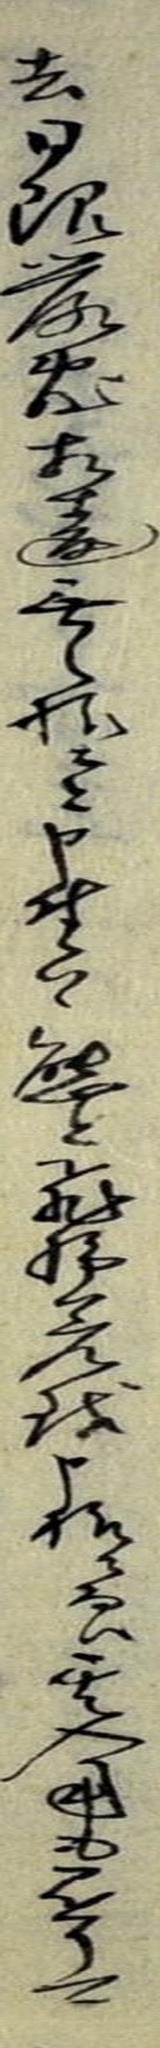去日限厳敷相違無之様ニと申付候ハヽ態と飛脚差越申様ニ而ハ其入用も懸り可
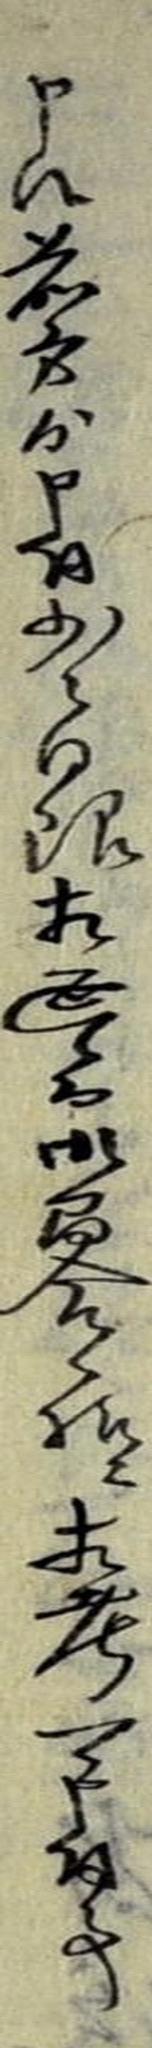申候前方ゟ申付少々日限相延候而御間合候様ニ相考可申付事
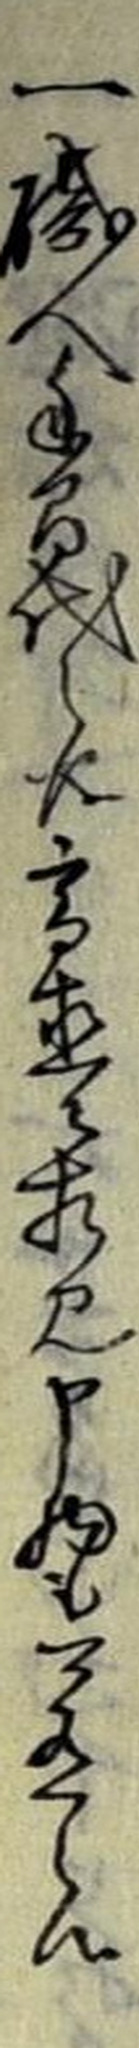一職人手間代之儀高直ニ相見申物も可有之候
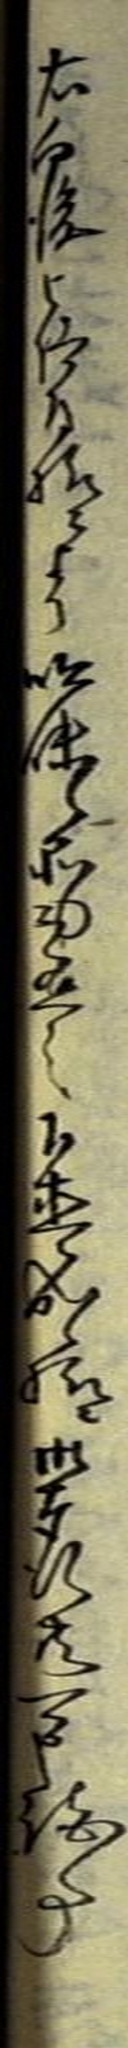右向後被仰付様ニより吟味之品も有之下直被成候様ニ御奉行共可申談事
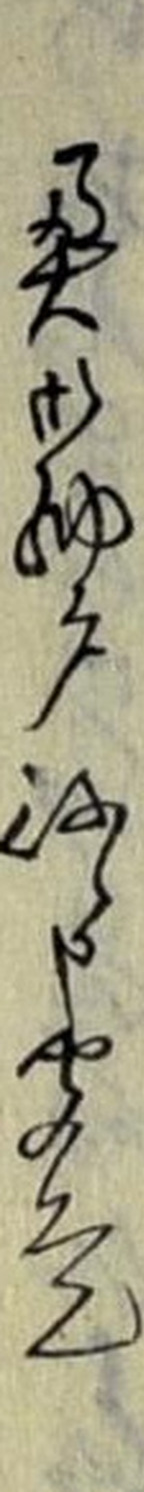奥御納戸役へ申聞覚
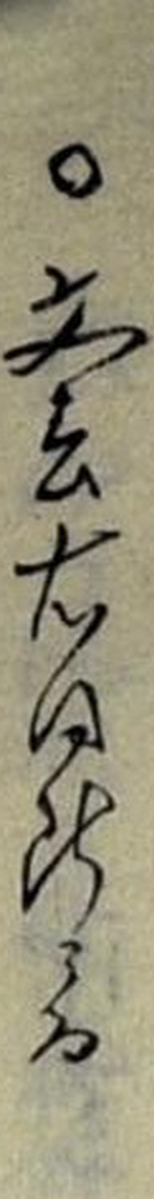〇文言右同断ニ而
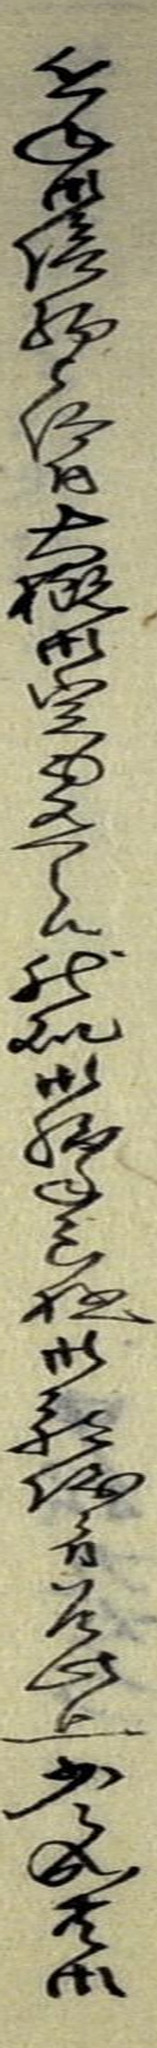近年御倹約被仰付大概御定も有之候然処御勝手至極御難儀ニ付乍此上少々成共御
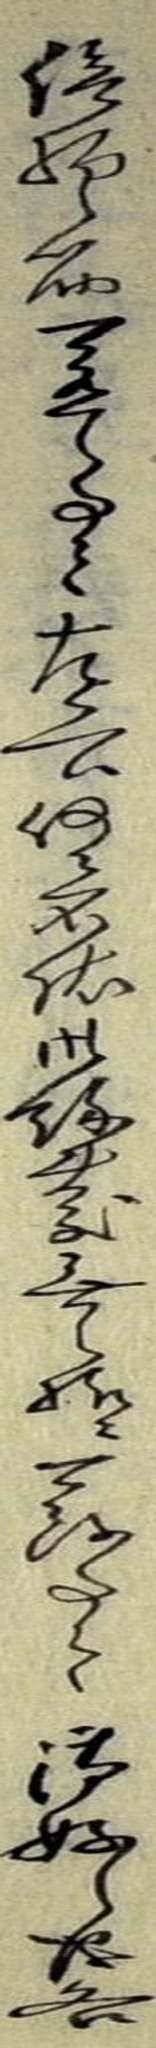倹約之筋可有之事ニ候左候ヘハ何ニ不依御余慶無之様ニ可致事ニ候御好之儀各
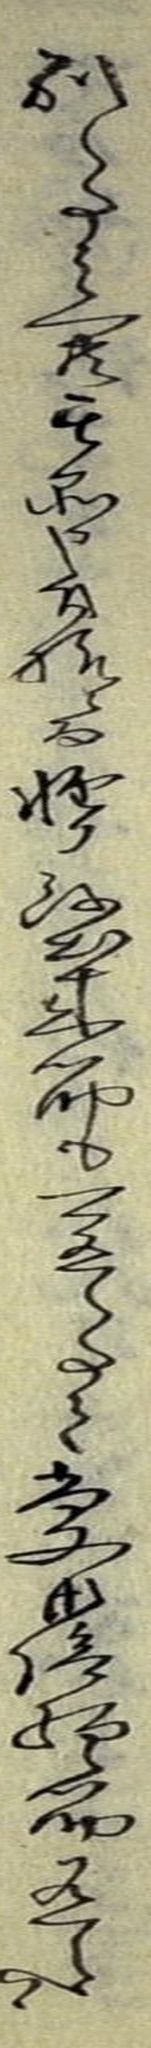別之事ニ候へ共其品申付様ニ而軽ク致出来筋も可有之事ニ候尚又御倹約之筋有之候ハヽ
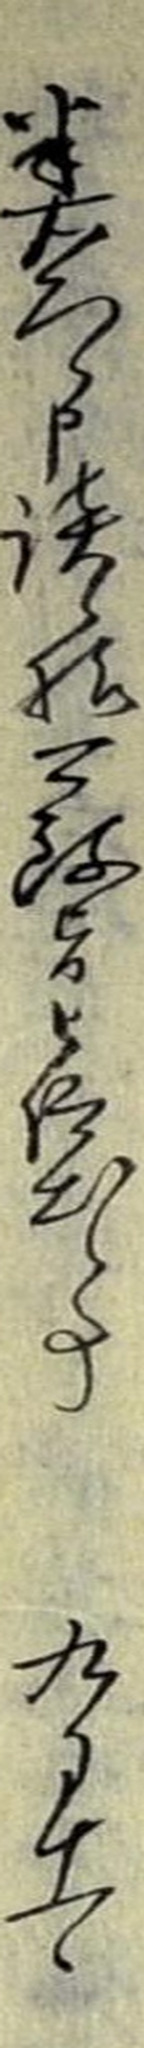半右衛門へ申談候様可致旨被仰出候事九月十一日
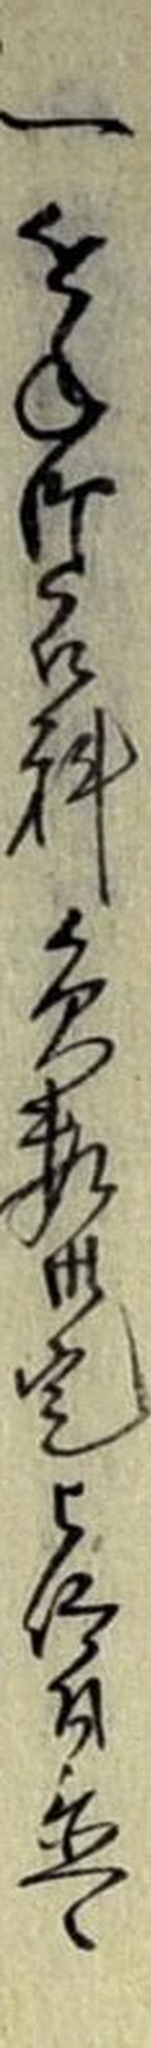一近年御召料員数御定被仰付置候
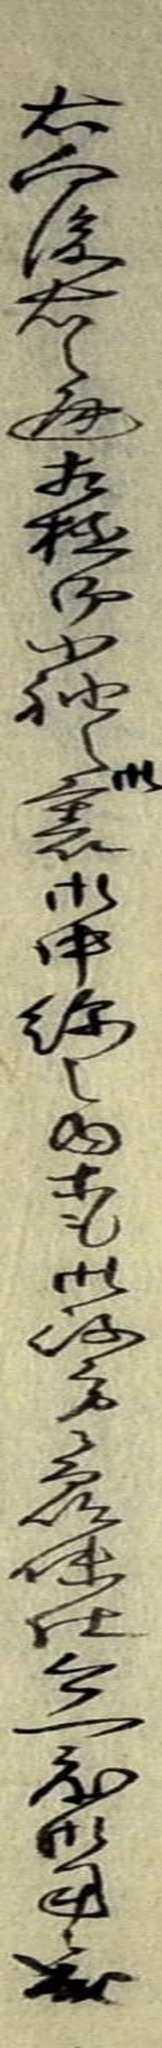右向後右之通相極御小袖之御裏御中綿之内等も御役方ニ而吟味仕今一度御用ニ成
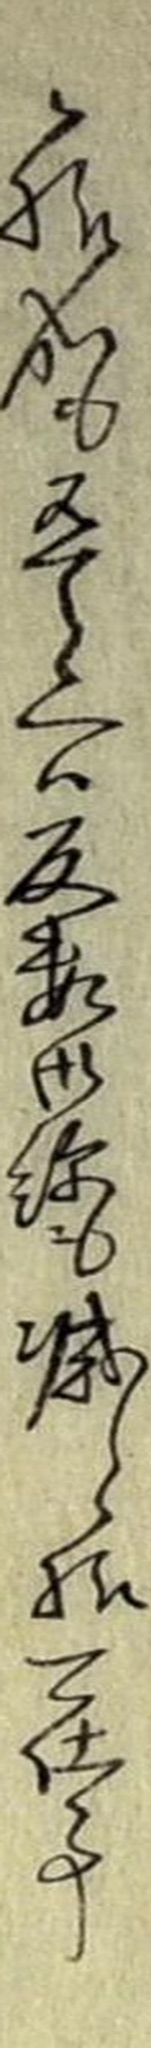候様成も有之候ヘハ反数御綿も減し候様可仕事
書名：命令之部 一
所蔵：福井県文書館 Fukui Prefectural Archives
